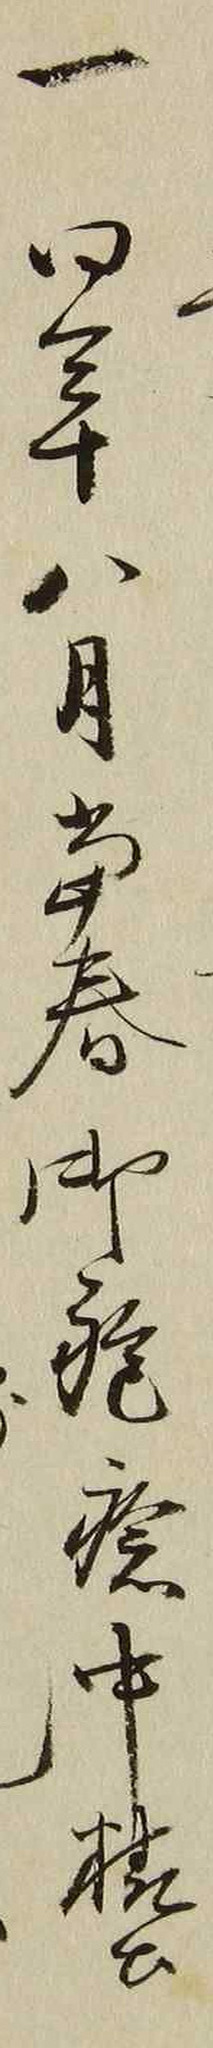一同年八月当春御施療中精出
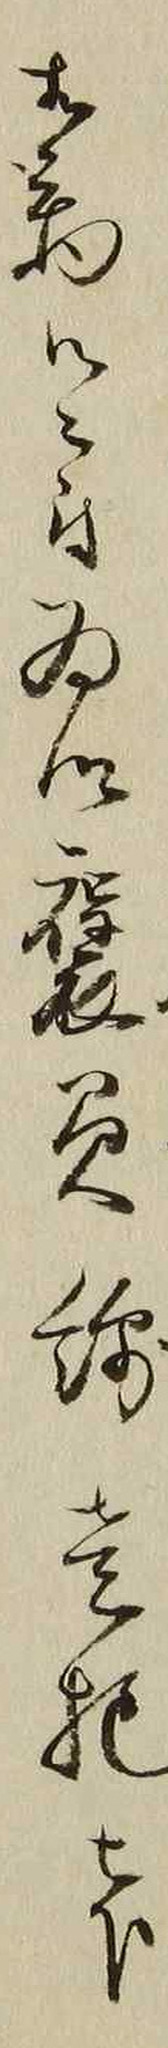相勤候に付為御褒美綿壱把被下
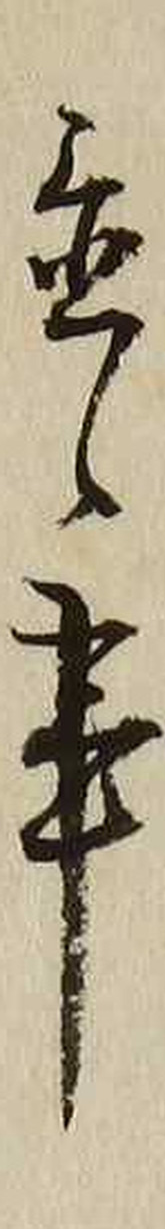置候事
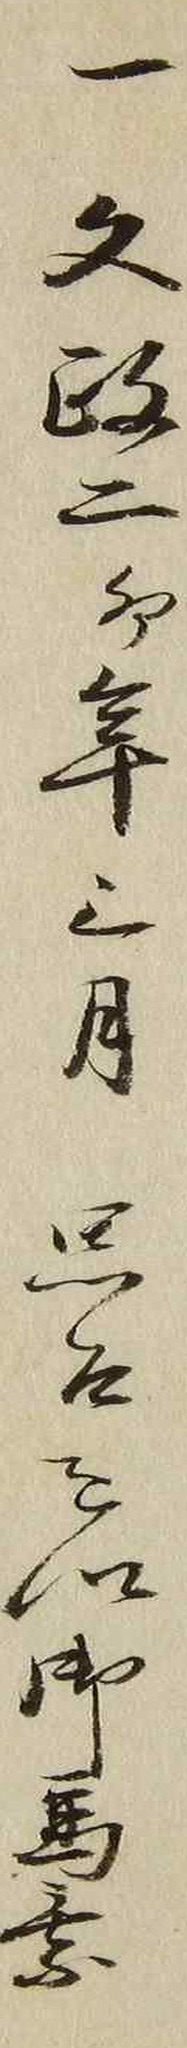一文政二卯年三月思召を以御馬乗
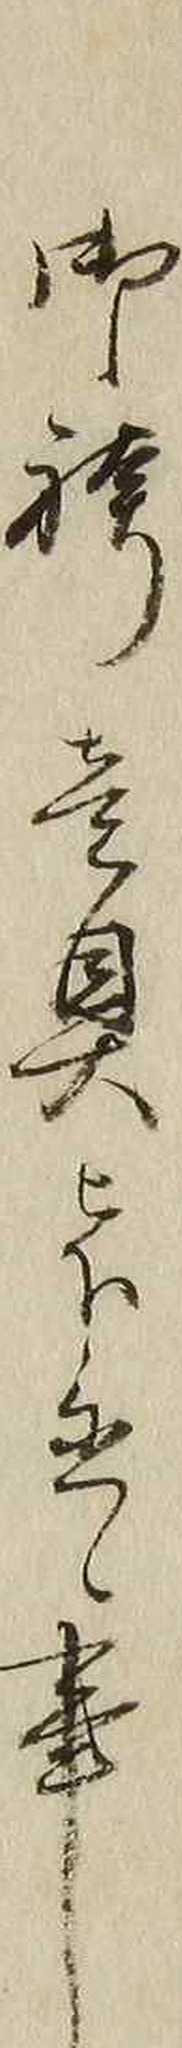御袴壱具被下置候事
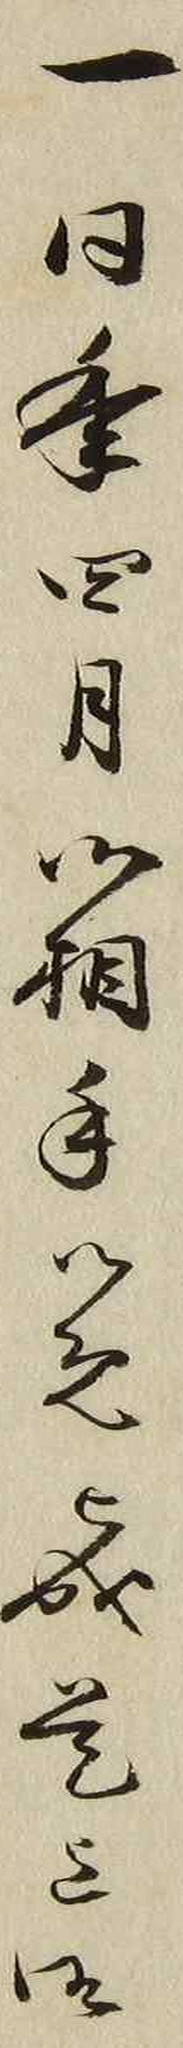一同年四月御相手御免被成是迄御
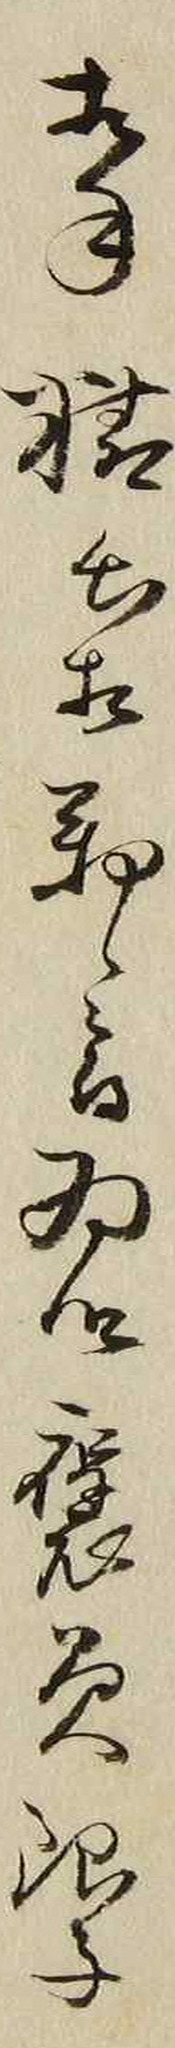相手精出相勤候に付為御褒美銀子
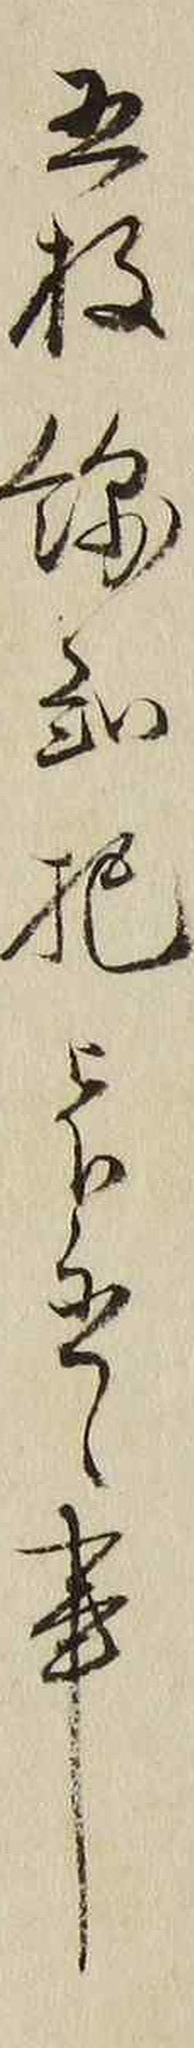五枚綿弐把被下置候事
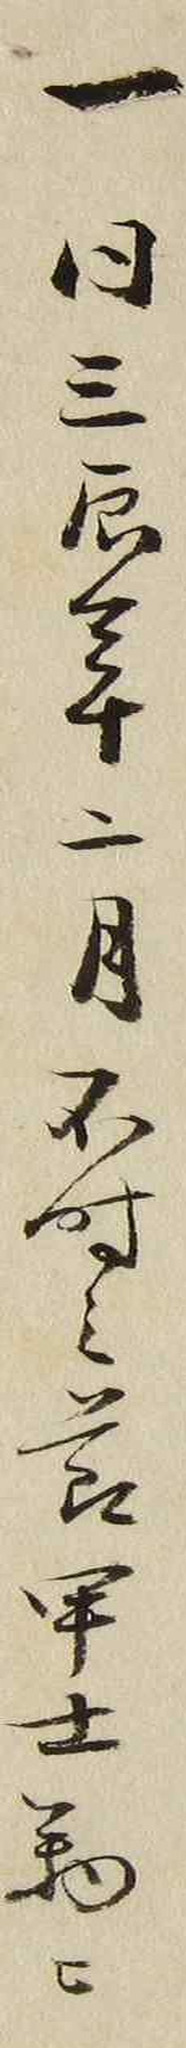一同三辰年二月不時之節甲士勤被
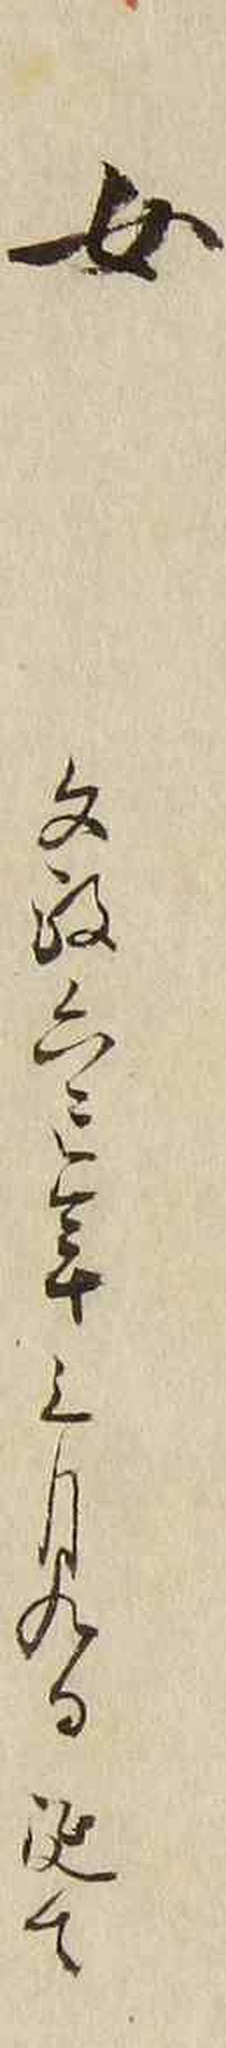女文政六未年三月九日誕生
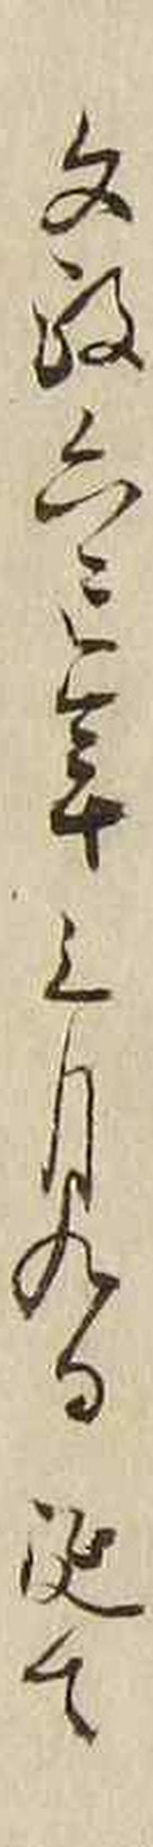女文政六未年三月九日誕生

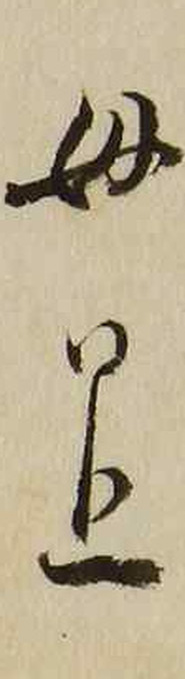母同上
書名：諸士系譜　巻之292　き之部1
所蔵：会津若松市立会津図書館
